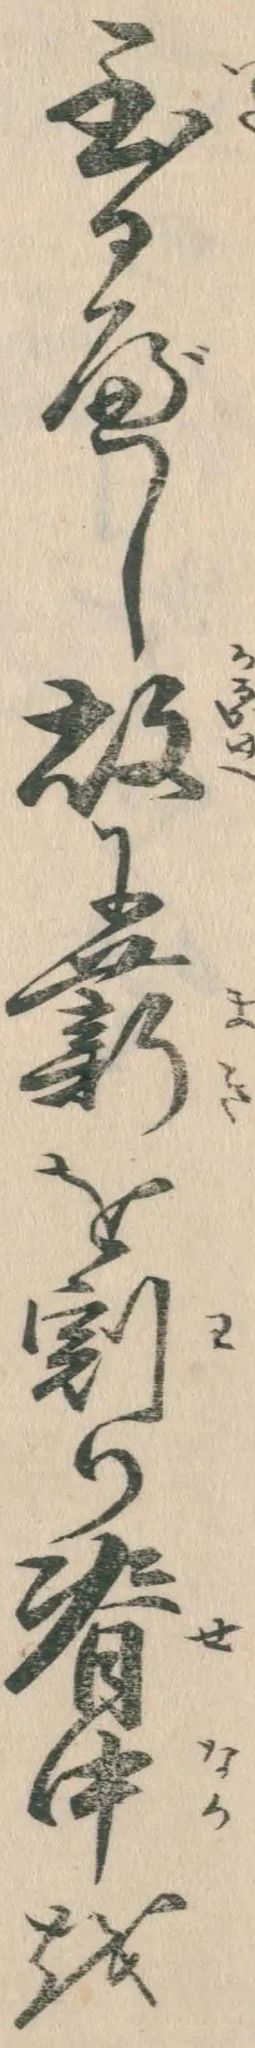至るべし故に薪を割り脊中を
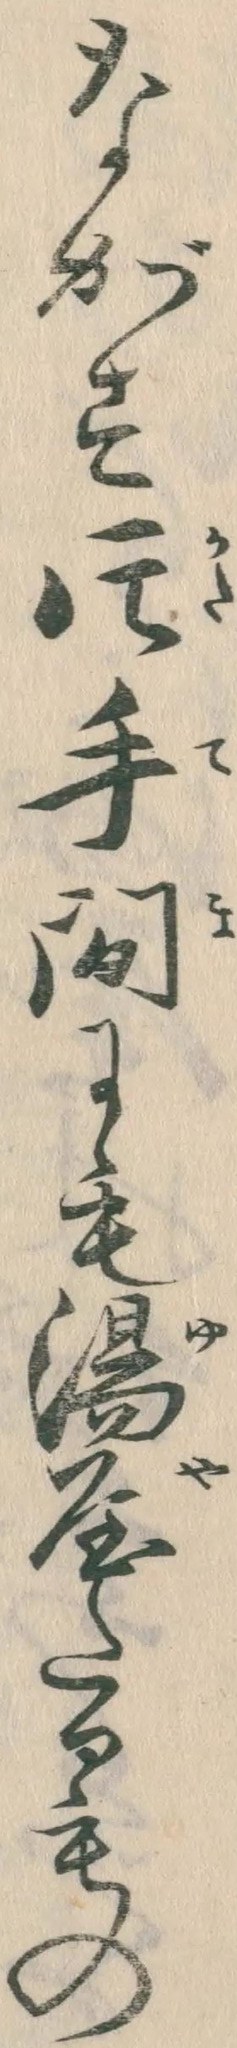ながす片手間にも湯屋たるもの
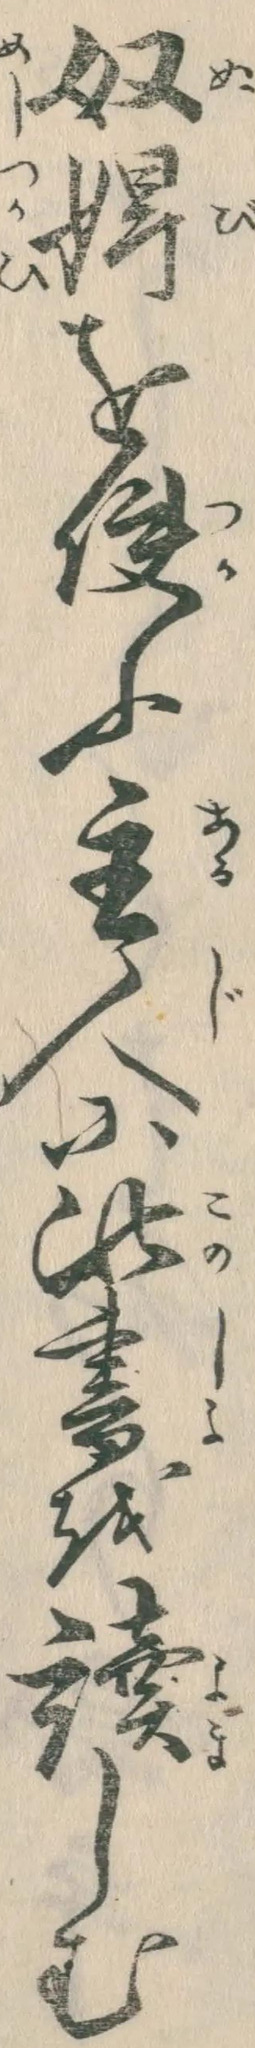奴婢を使ふ主人に此書を読しむ
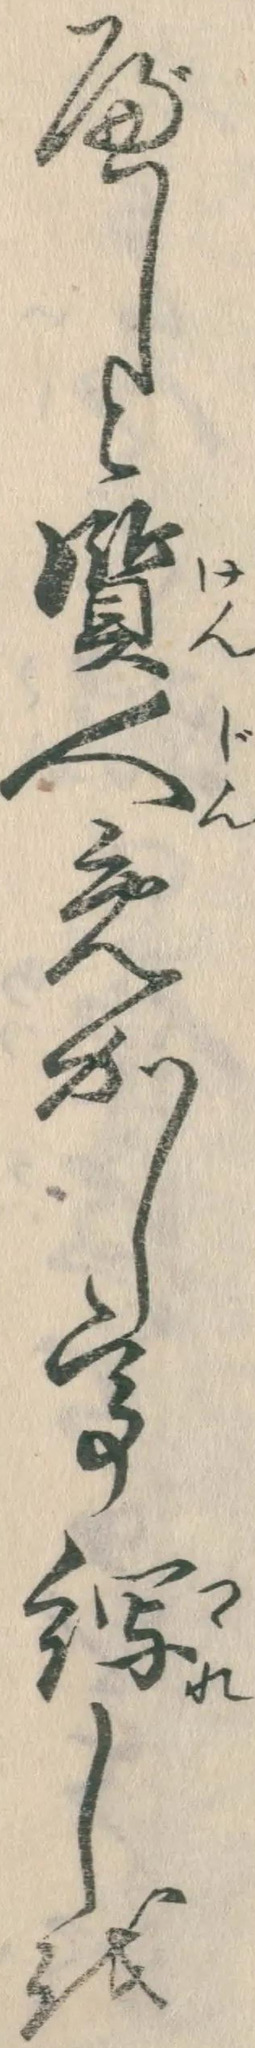べしと賢人めかしてしを
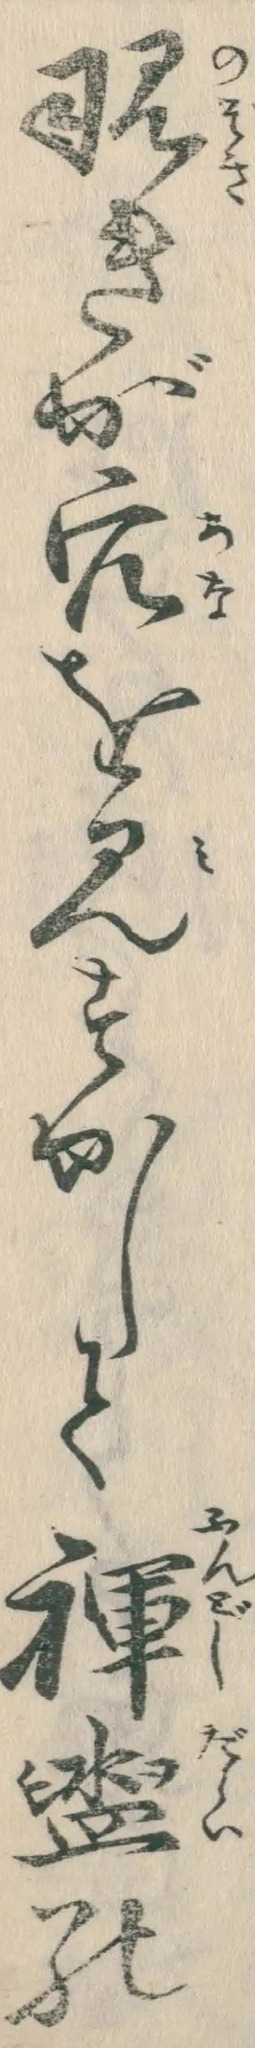覗きが穴を見すかして褌盥の
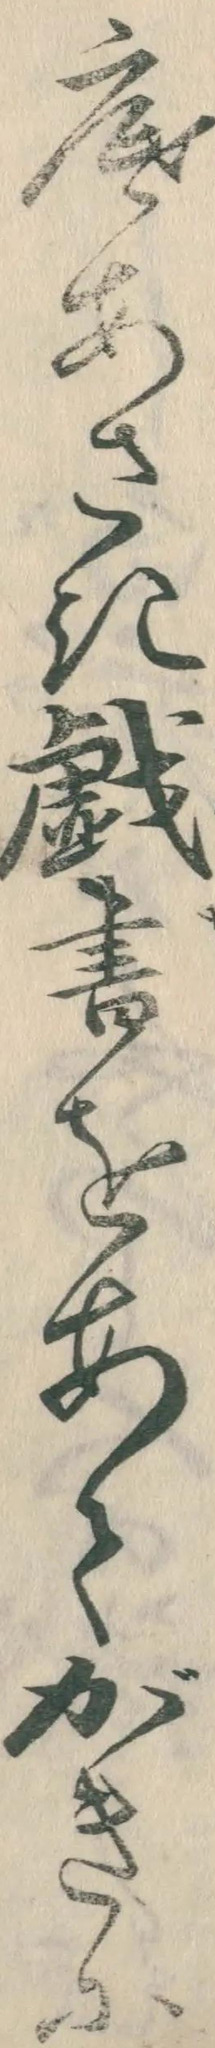底あさき戯書をあてがきに

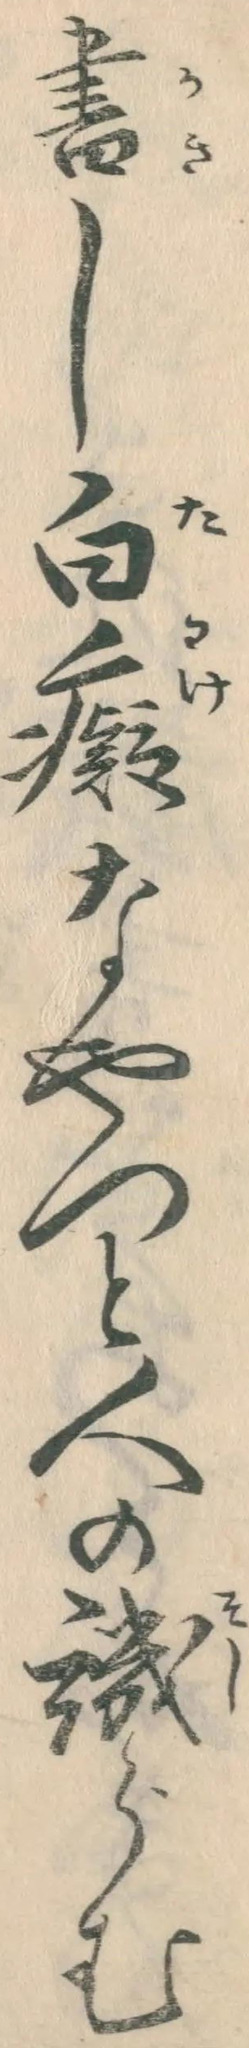書し白痴なやつと人の譏らむ
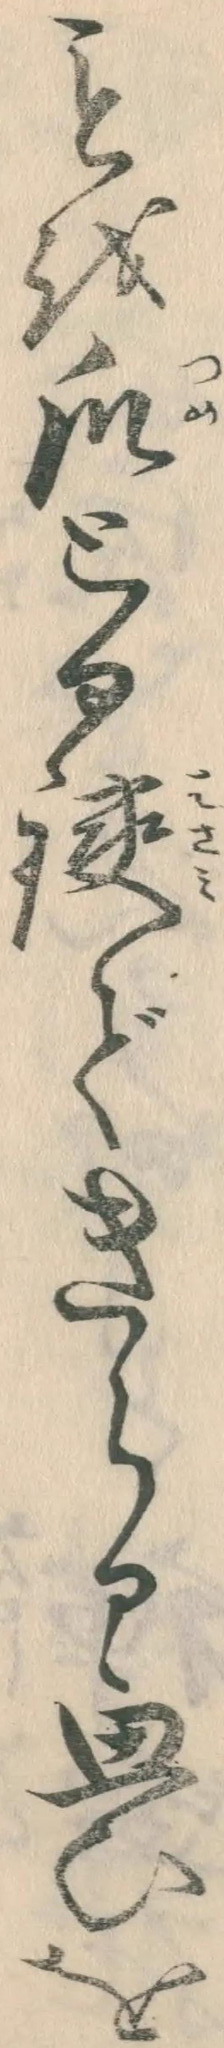事を爪とる鋏できらりと思ひを
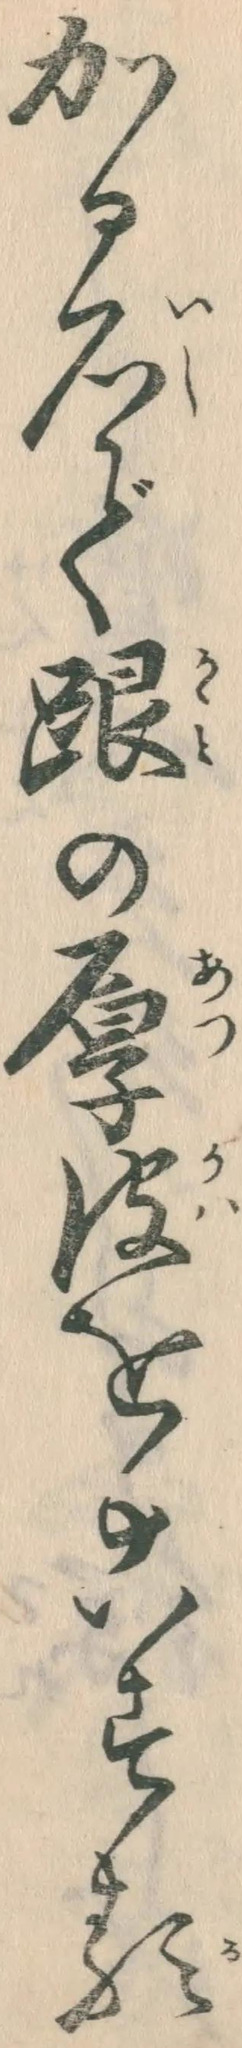かる石で踉の厚皮をこする
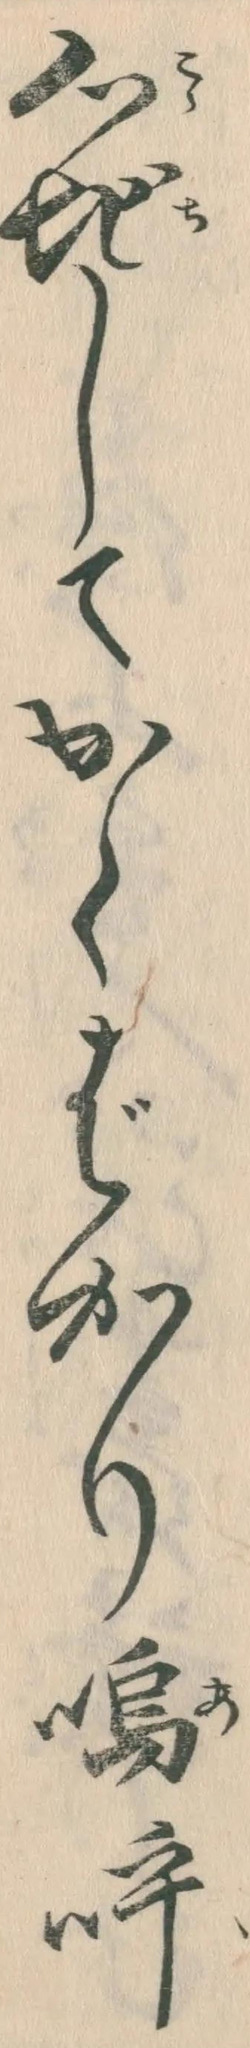心地してかくばかり嗚呼
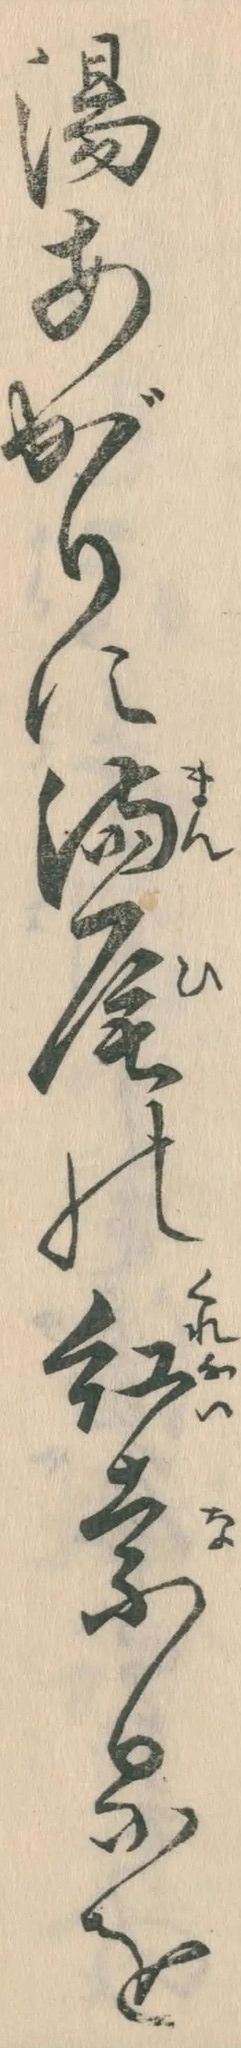湯あがりに満尾の紅奈るを
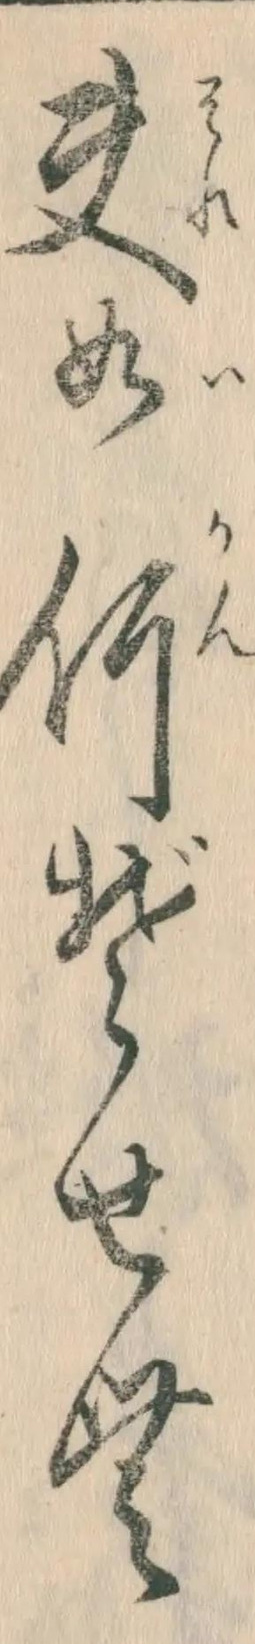夫如何ぞせむ
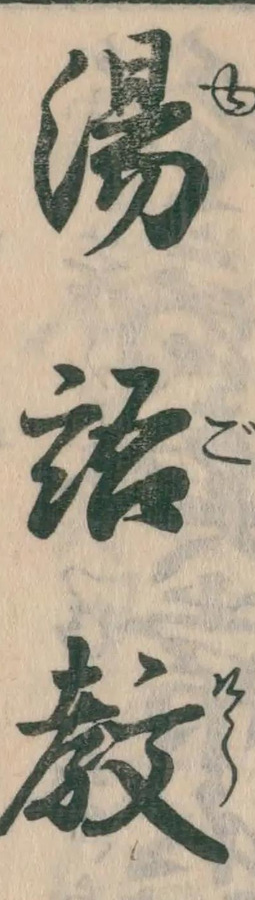湯語教
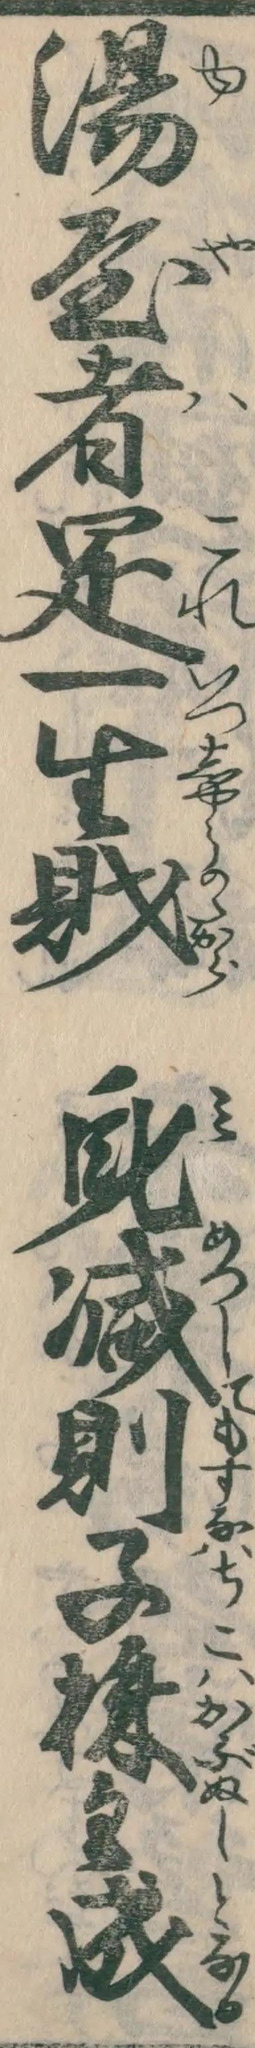湯屋者是一生財身滅則子株主成

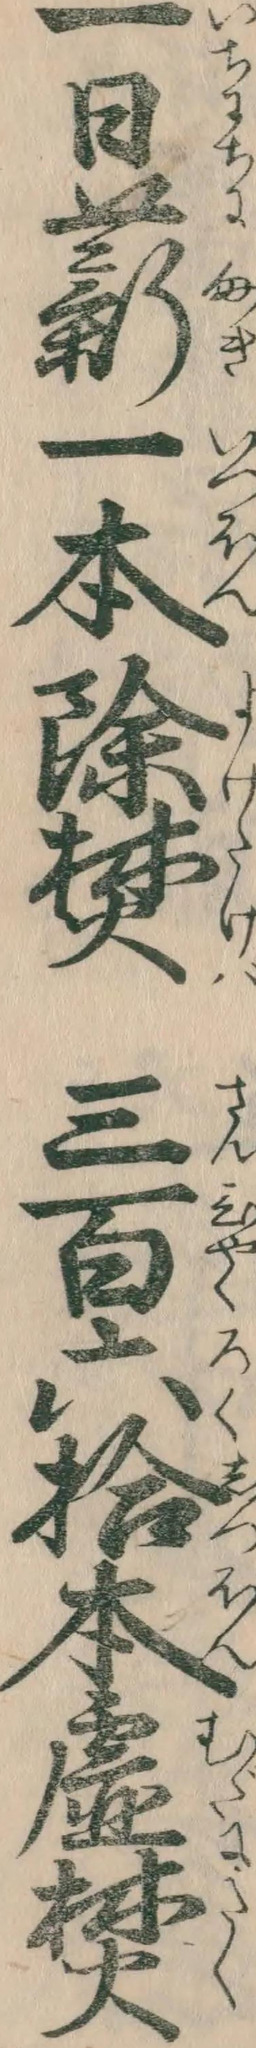一日薪一本除焚三百六拾本虚焚

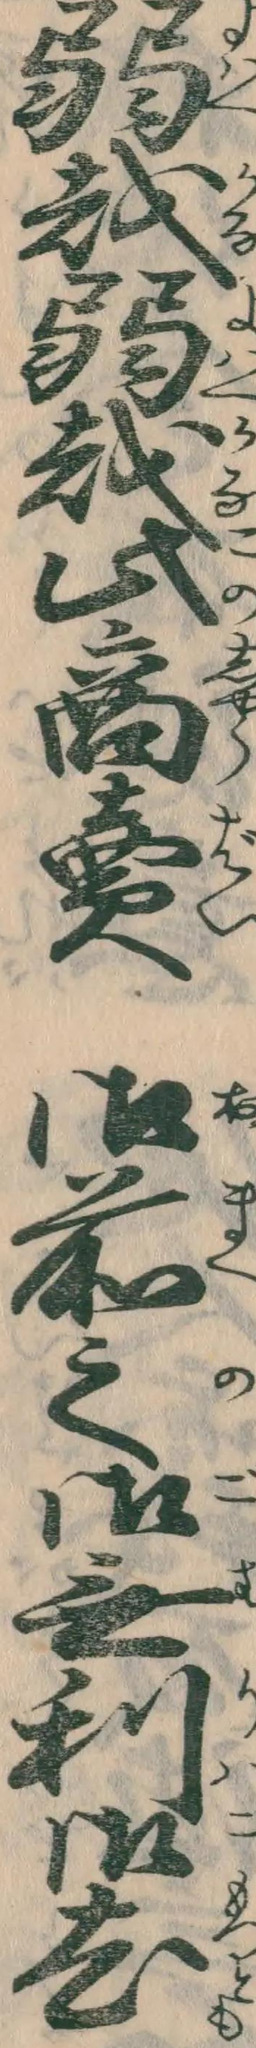弱哉弱哉此商売御前之御無理御尤
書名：洗湯手引草
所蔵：国立国会図書館 National Diet Library, JAPAN
